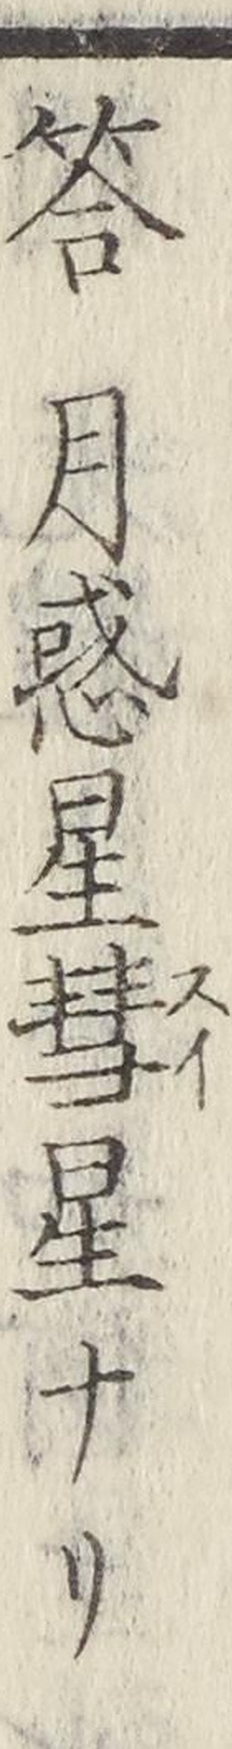答月惑星彗星ナリ
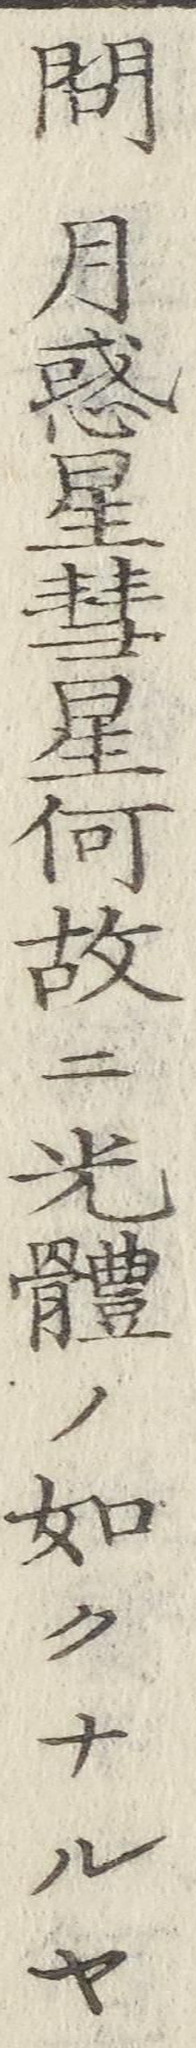問月惑星彗星何故ニ光体ノ如クナルヤ
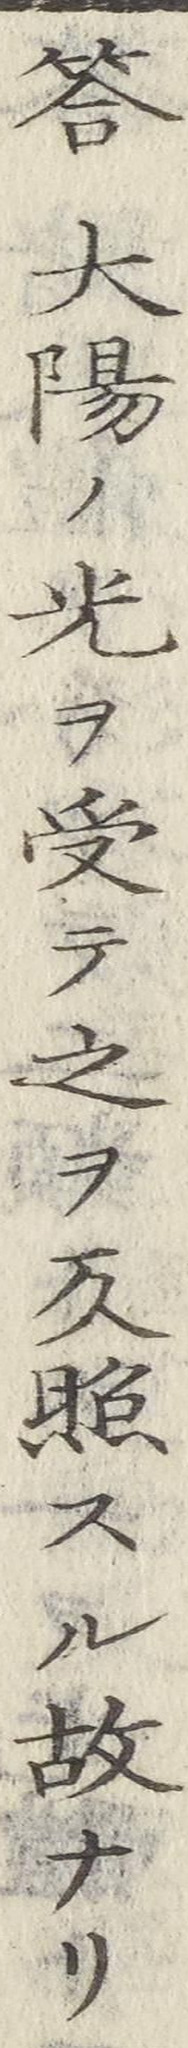答大陽ノ光ヲ受テ之ヲ反照スル故ナリ
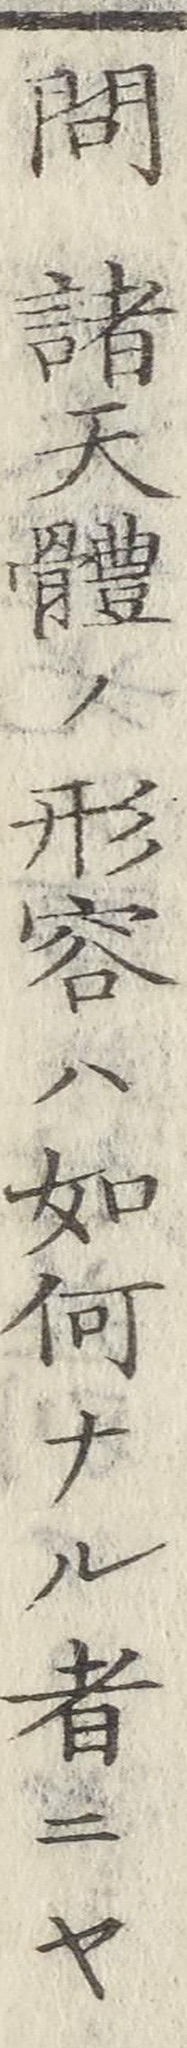問諸天体ノ形容ハ如何ナル者ニヤ
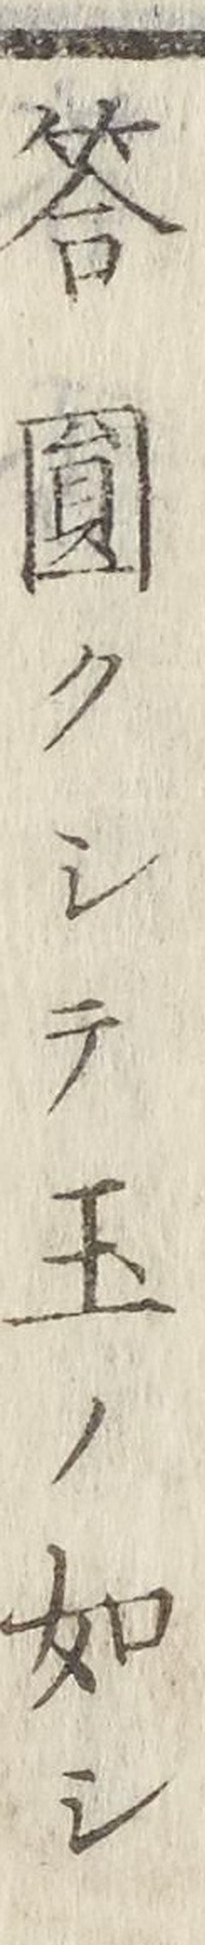答円クシテ玉ノ如シ
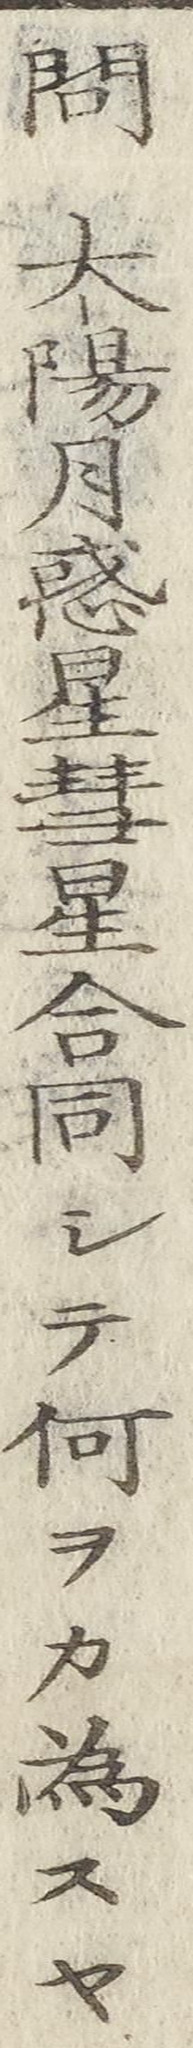問大-陽月惑星彗星合同シテ何ヲカ為スヤ
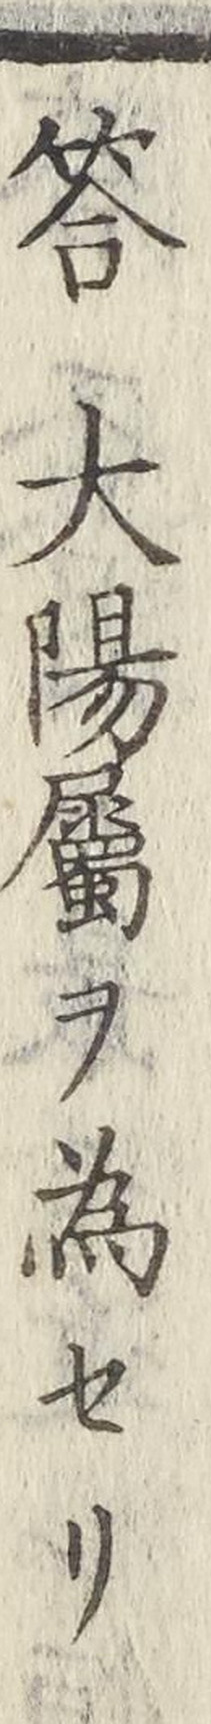答大陽属ヲ為セリ
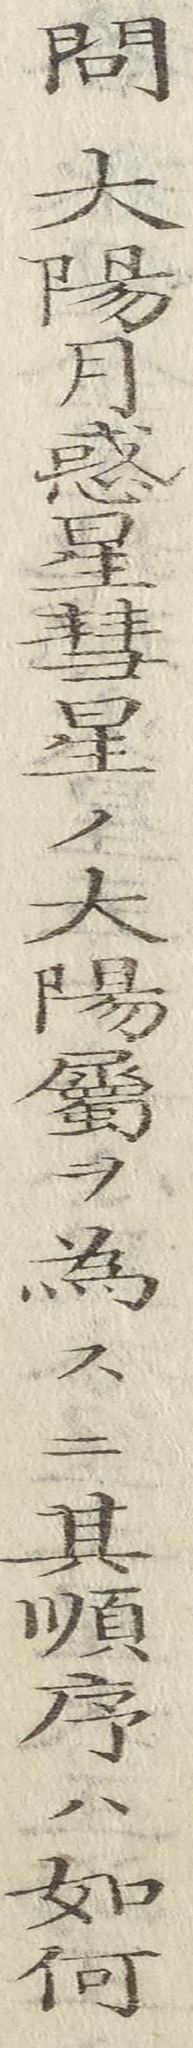問大陽月惑星彗星ノ大陽属ヲ為スニ其順序ハ如何
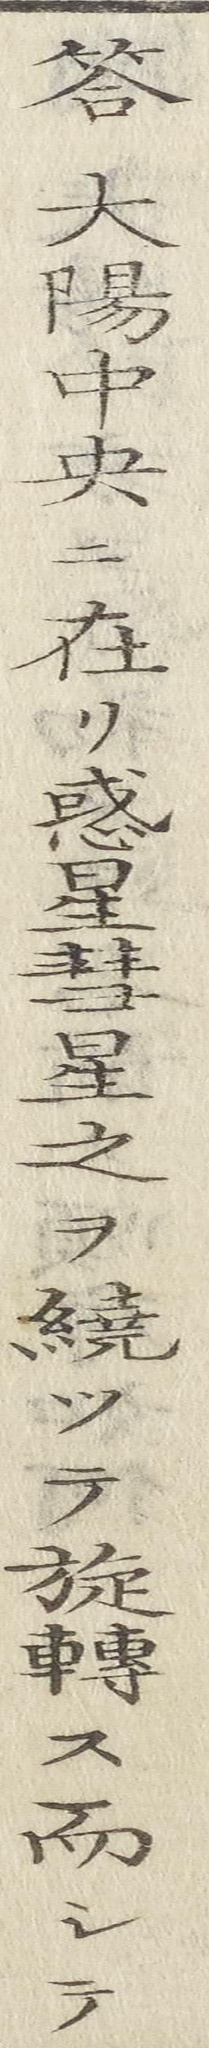答大陽中央ニ在リ惑星彗星之ヲ繞ツテ旋転ス而シテ
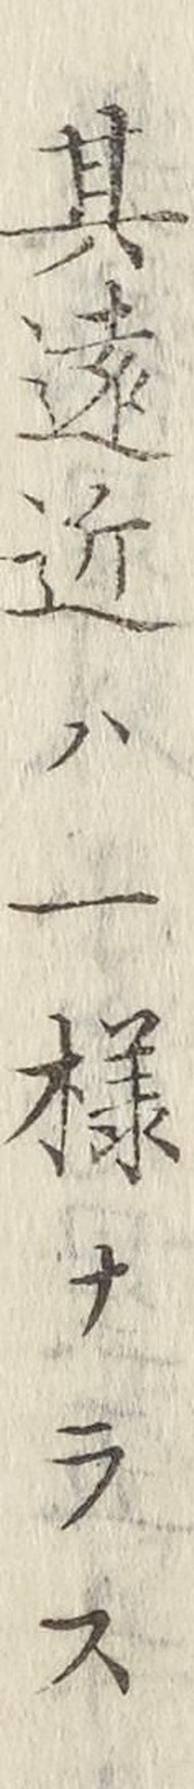其遠近ハ一様ナラス
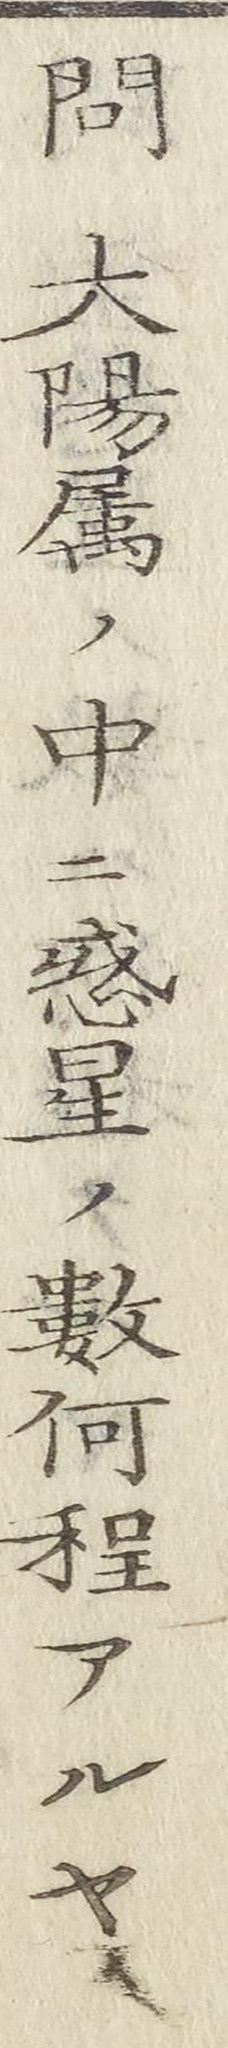問大陽属ノ中ニ惑星ノ数何程アルヤ
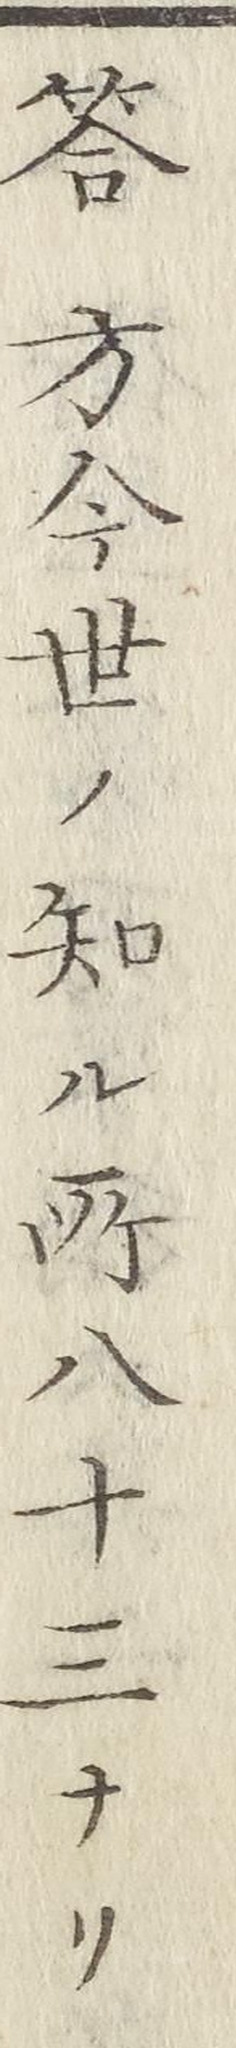答方今世ノ知ル所八十三ナリ
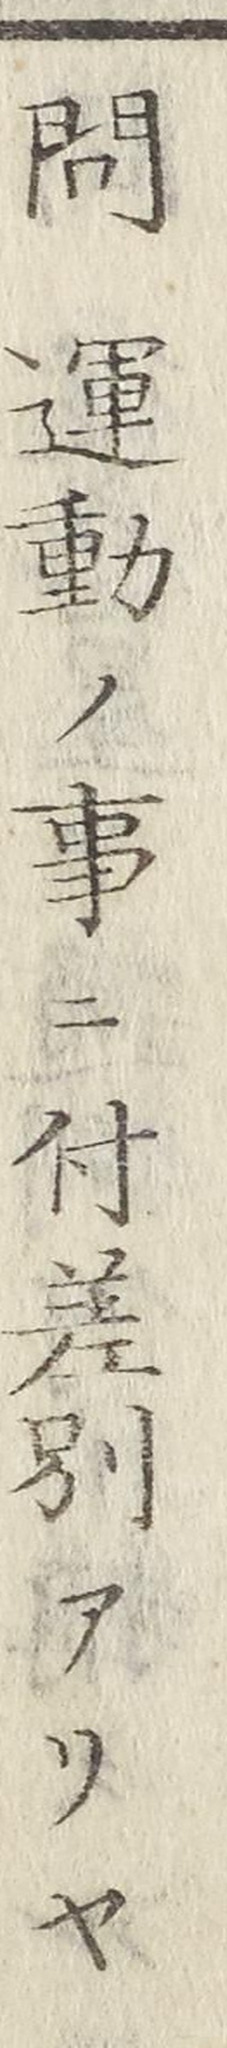問運動ノ事ニ付差別アリヤ
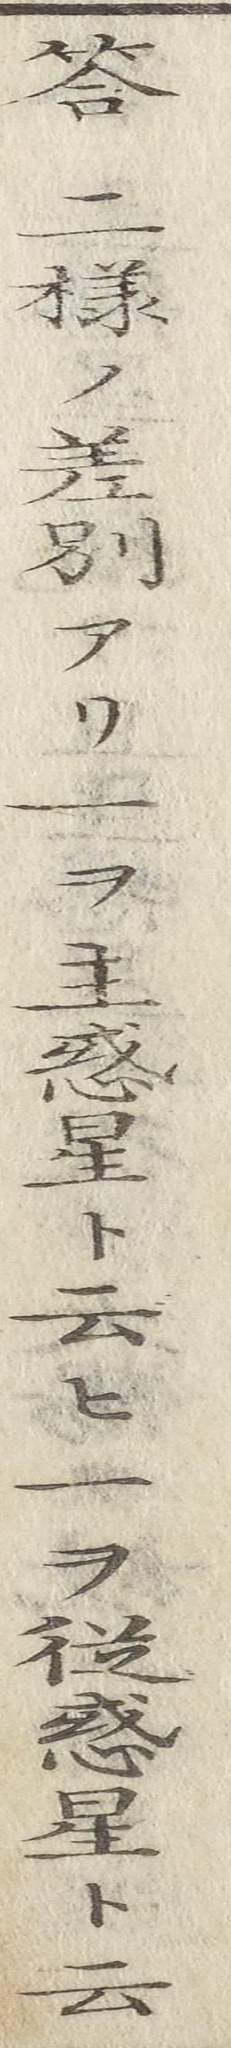答二様ノ差別アリ一ヲ主惑星ト云ヒ一ヲ従惑星ト云
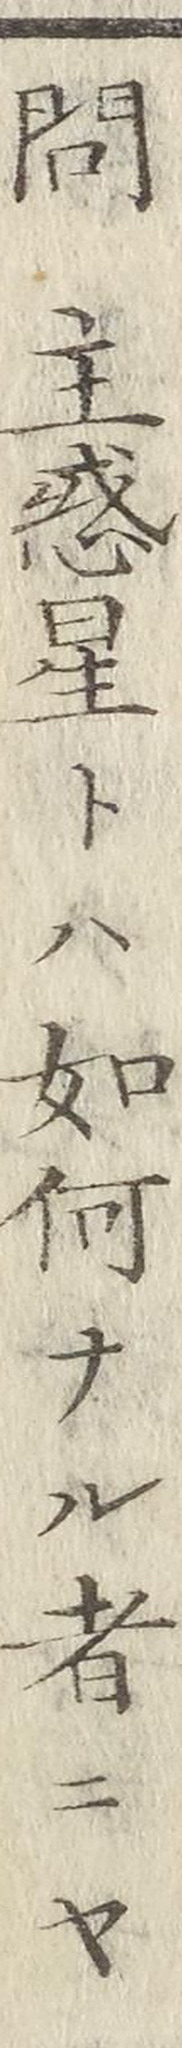問主惑星トハ如何ナル者ニヤ

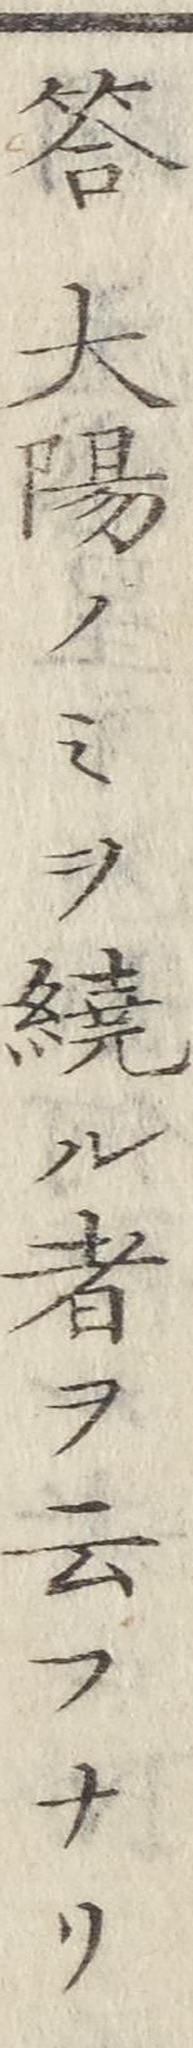答大陽ノミヲ繞ル者ヲ云フナリ
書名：星学圖説　上
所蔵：東京大学地震研究所図書室 Earthquake Research Institute Library, The University of Tokyo, JAPAN
